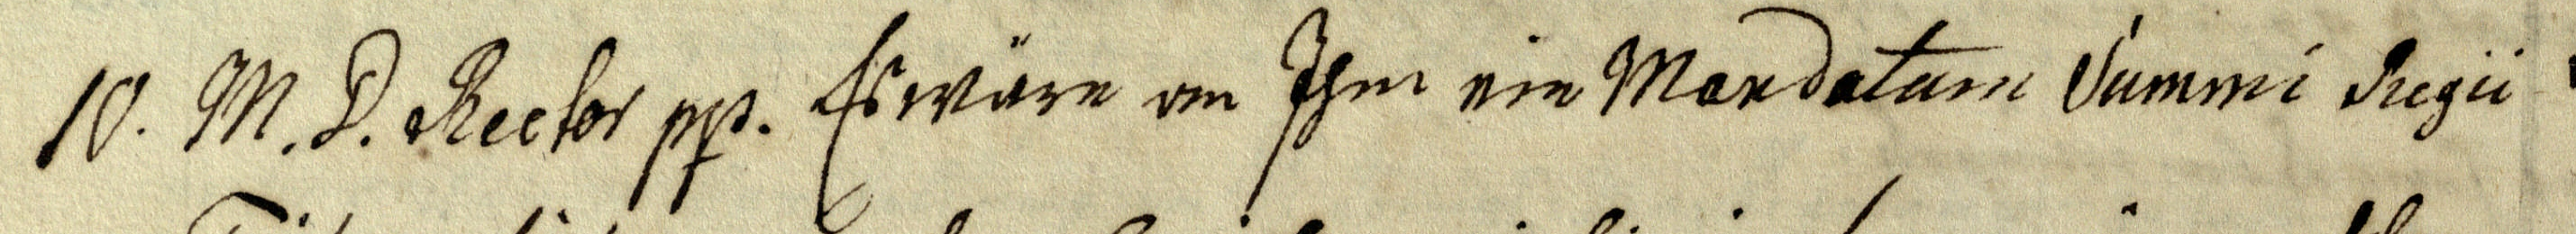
10. M. D. Rector pp. Es wäre an Ihm ein Mandatum Summi Regii
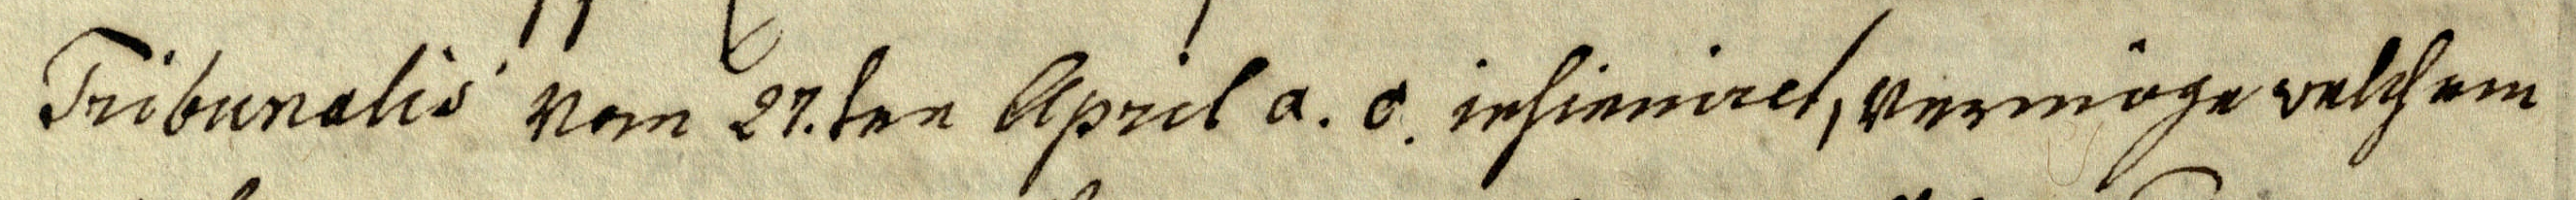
Tribunalis vom 27. ten April a. c. inhieniret, vermöge welchem
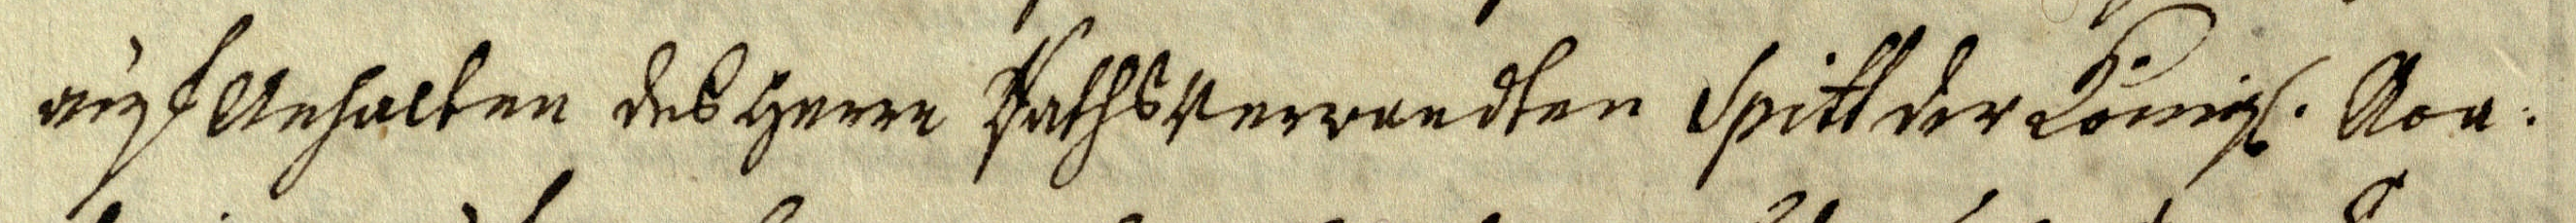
auf Anhalten des Herrn Rathsverwandten Spitt der Königl. Aca¬
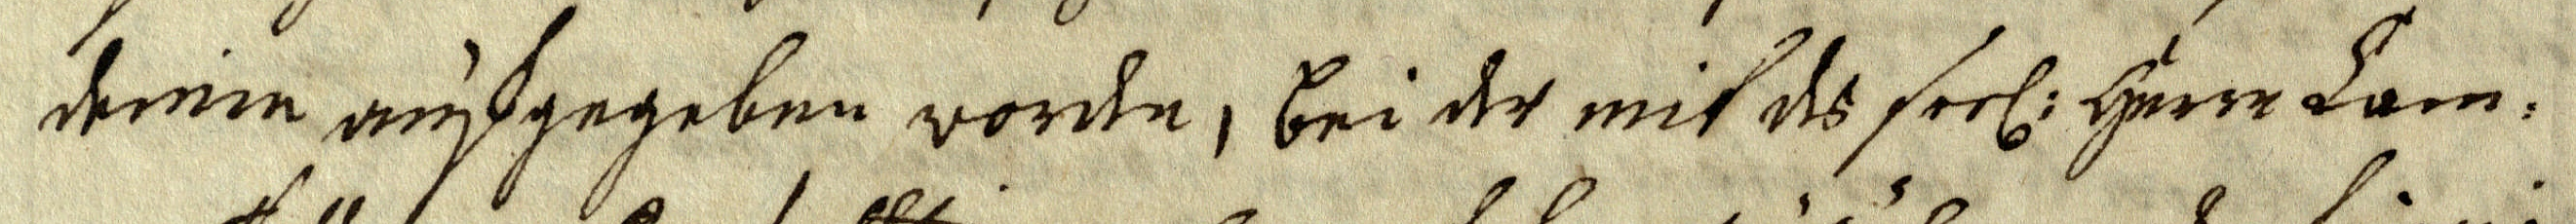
demie aufgegeben worden, bei der mit des seel. Herrn Cam¬
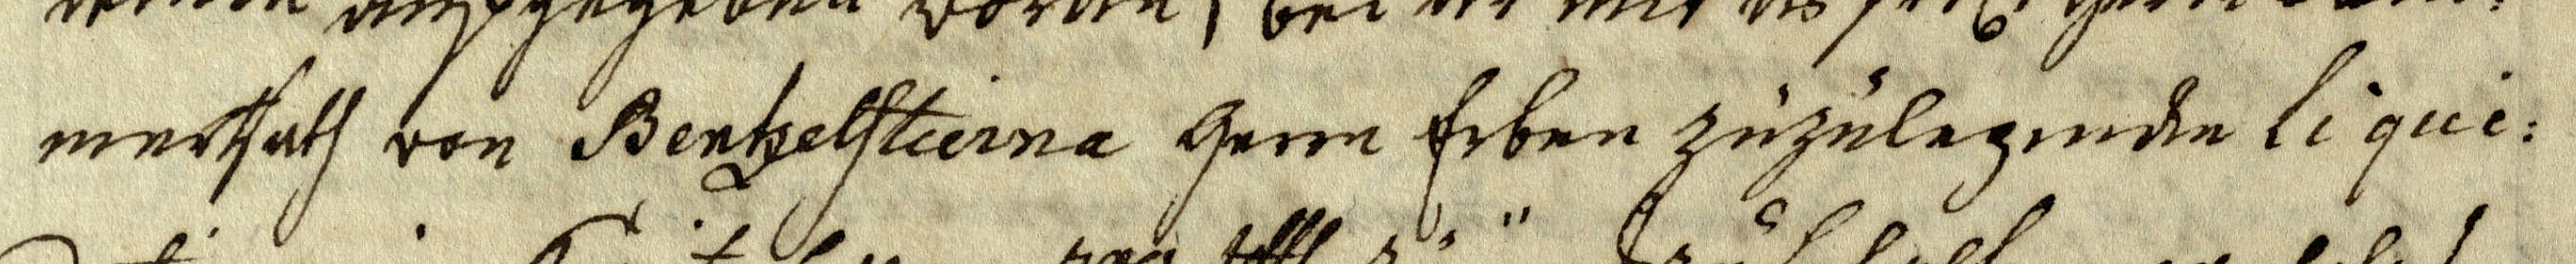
merRath von Bentzelstierna Herrn Erben zuzulegenden Liqui¬
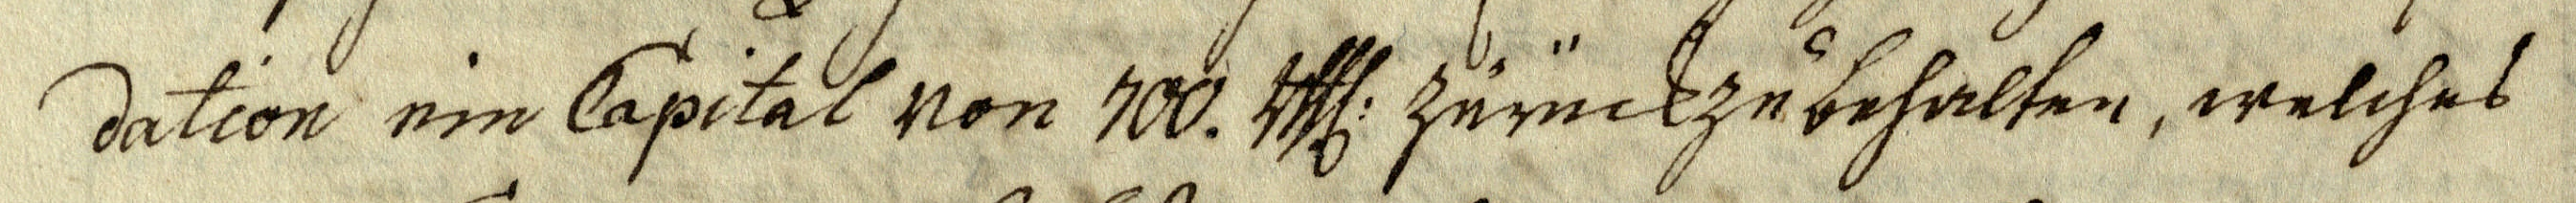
dation ein Capital von 700 Rtl. zurückzubehalten, welches
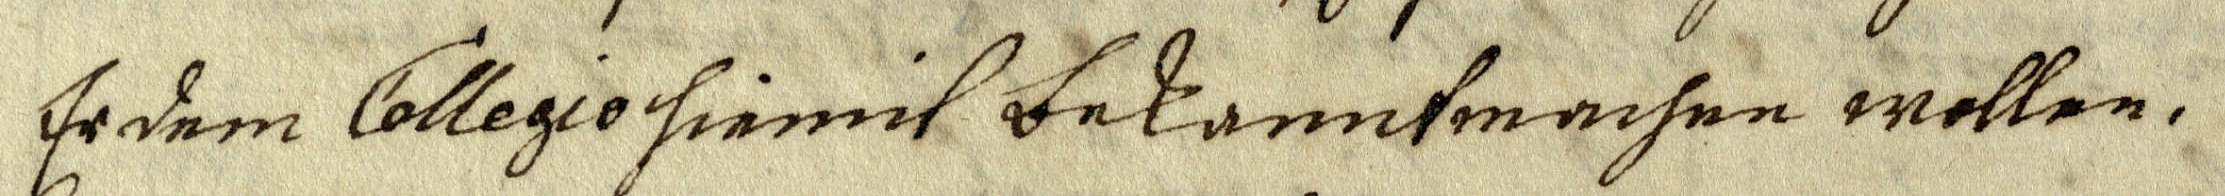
Er dem Collegio hiemit bekanntmachen wollen.
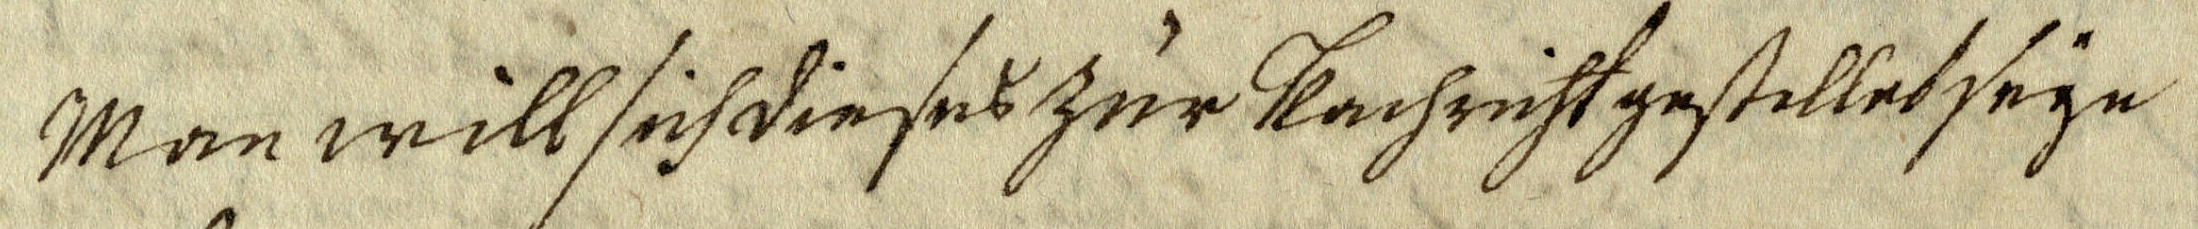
Man will sich dieses zur Nachricht gestellet seÿn
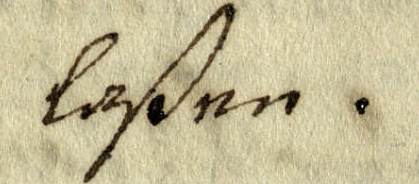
laßen.
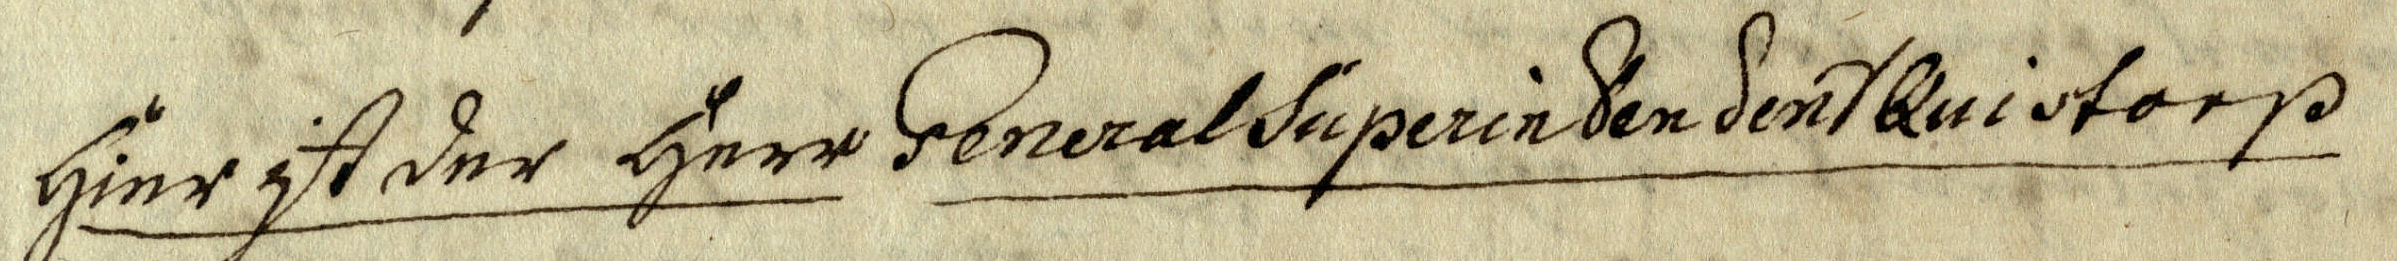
Hier ist der Herr GeneralSuperindendent Quistorp
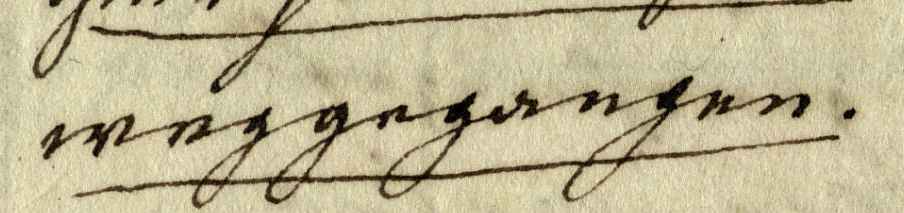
weggegangen.
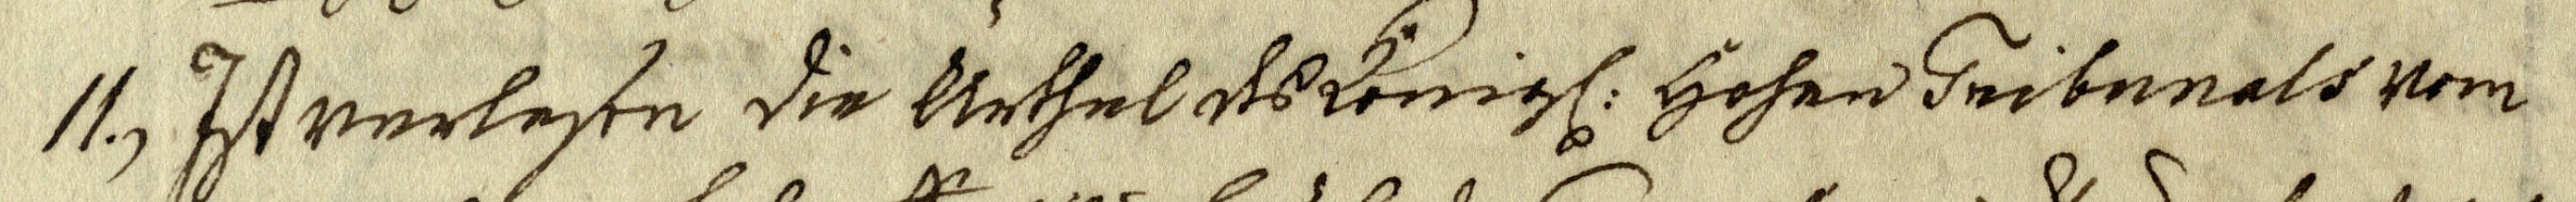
11. Ist verlesen die Urthel des Königl. Hohen Tribunals vom
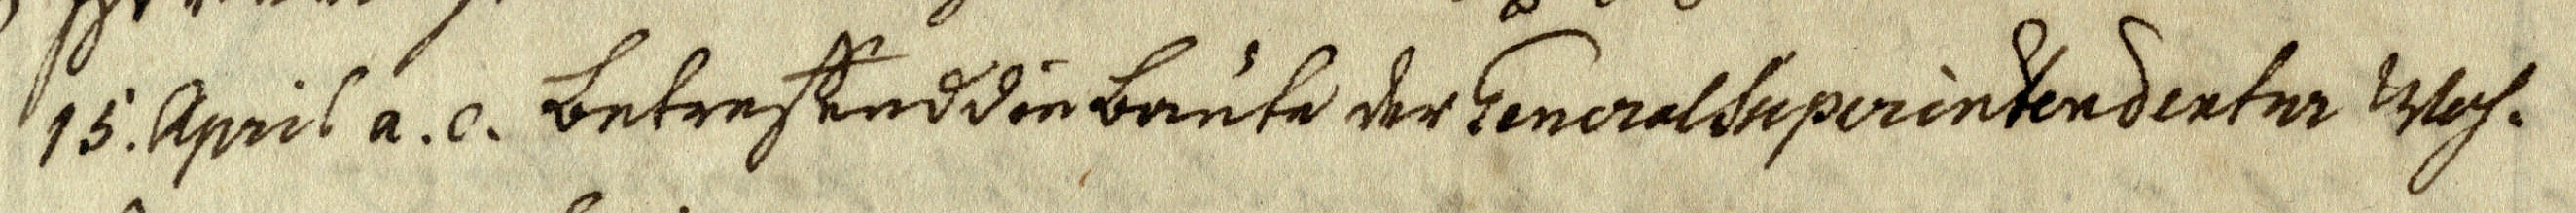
15. April a. c. betreffend die Baute der GeneralSuperintendentur Woh¬
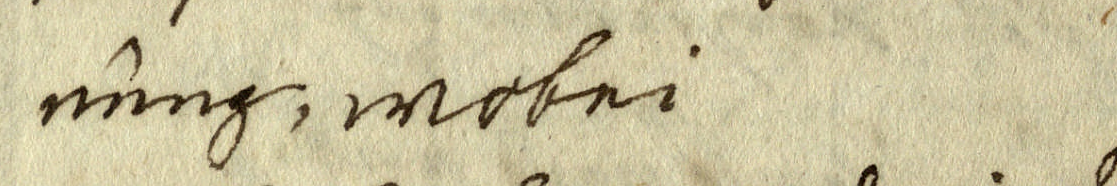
nung, wobei
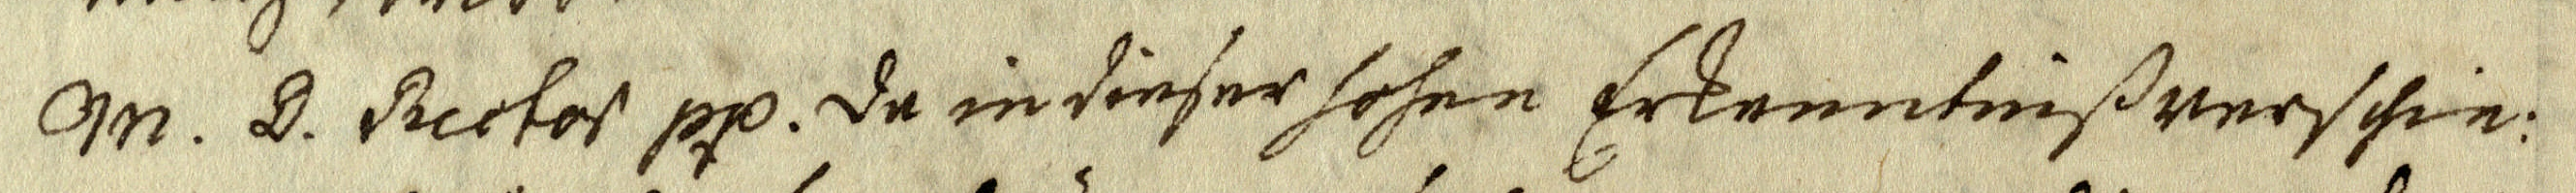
M. D. Rector pp. Da in dieser hohen Erkenntniß verschie¬
